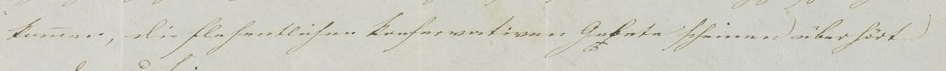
kommen, die flehentlichen konservativen Gebete scheinen überhört
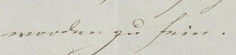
worden zu sein. –
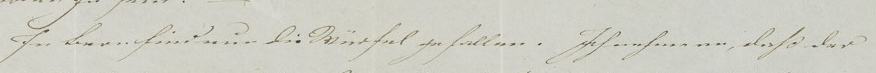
In Bern sind nun die Würfel gefallen. Ich nehme an, daß der
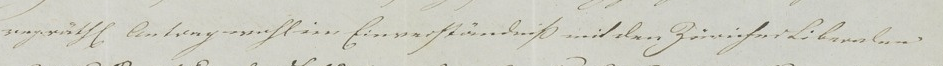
reg.räthl. Antrag wohl im Einverständniß mit den Züricher Liberalen
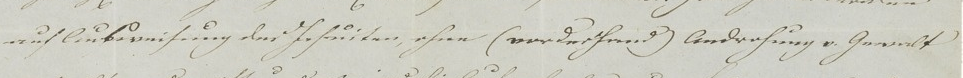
auf Ausweisung der Jesuiten, ohne (vor der Hand) Androhung v. Gewalt
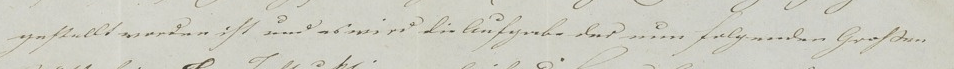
gestellt worden ist und es wird die Aufgabe der nun folgenden Großen
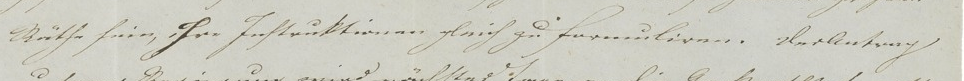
Räthe sein, ihre Instruktionen gleich zu formuliren. Der Antrag
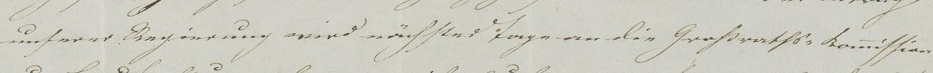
unserer Regierung wird nächster Tage an die Großraths-Kommission
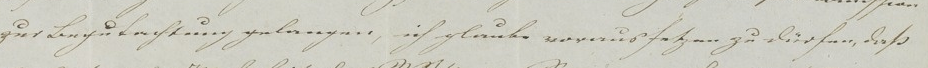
zur Begutachtung gelangen, ich glaube voraussetzen zu dürfen, daß
